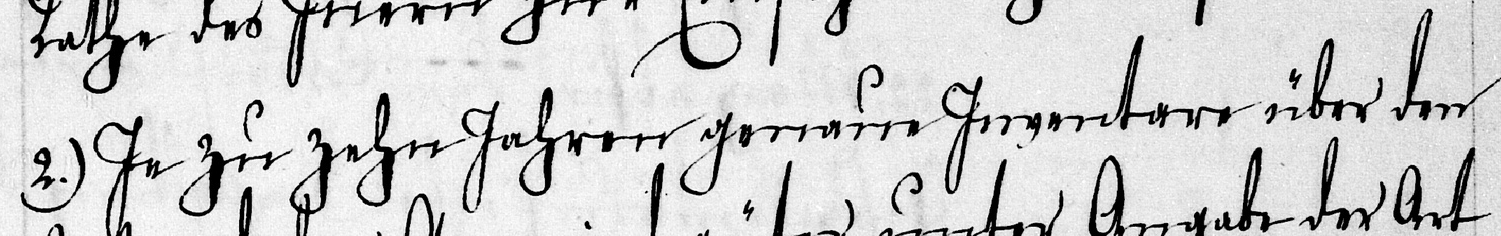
2.) In zu zehn Jahren genaue Inventare über den
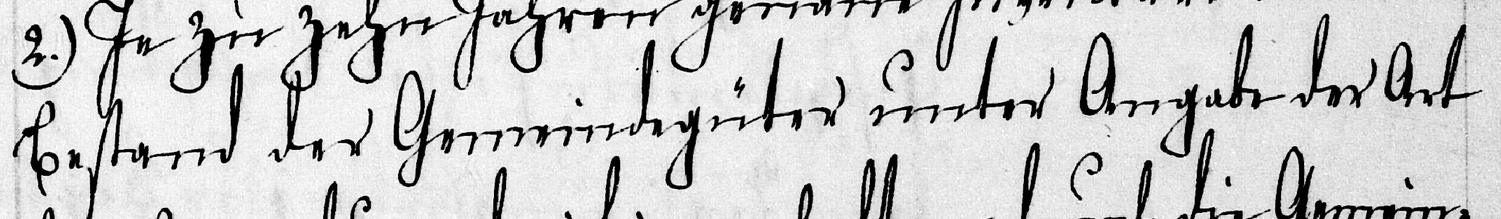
Bestand der Gemeindegüter unter Angabe der Art
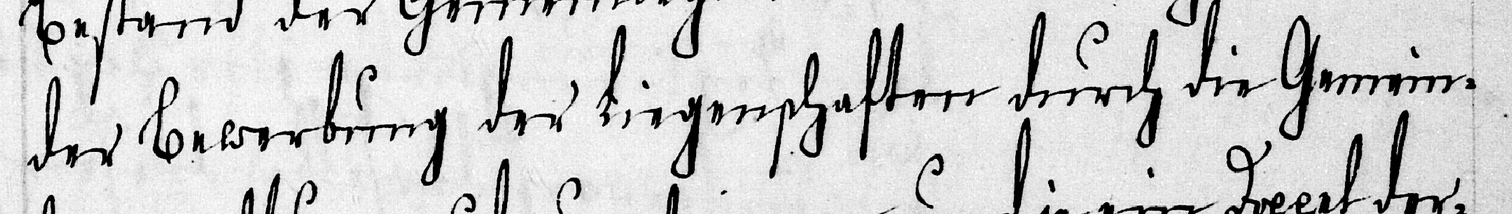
der Bewerbung der Liegenschaften durch die Gemein¬
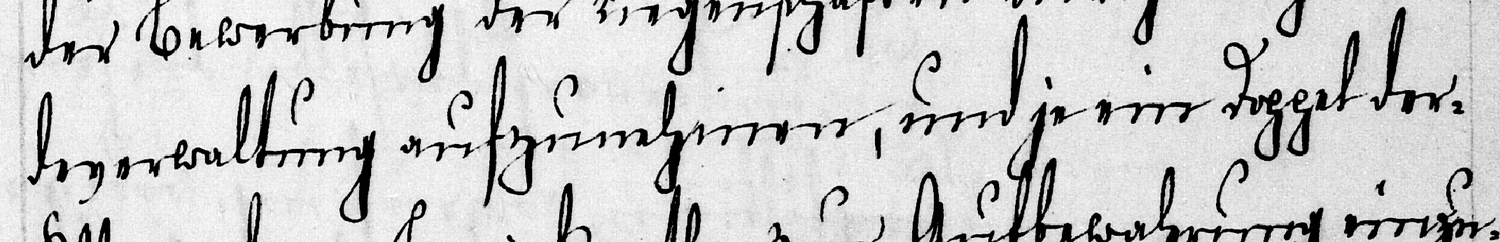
deverwaltung aufzunehmen, und je ein Doppel der¬
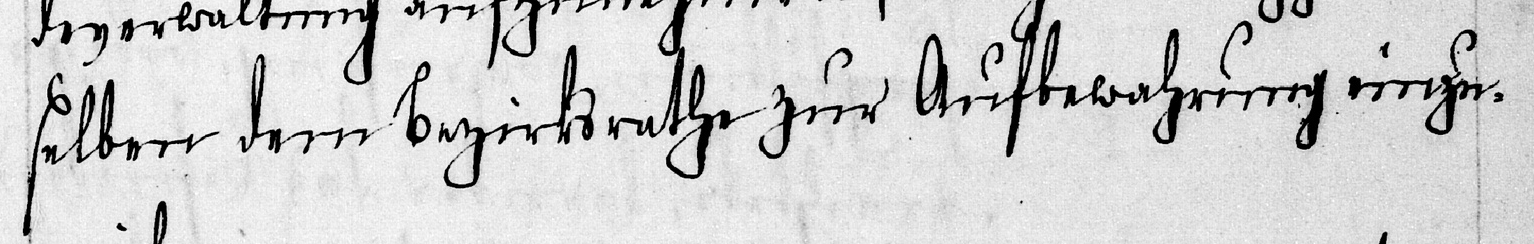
selben dem Bezirksrathe zur Aufbewahrung einzu¬
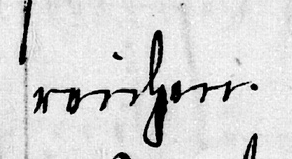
reichen.
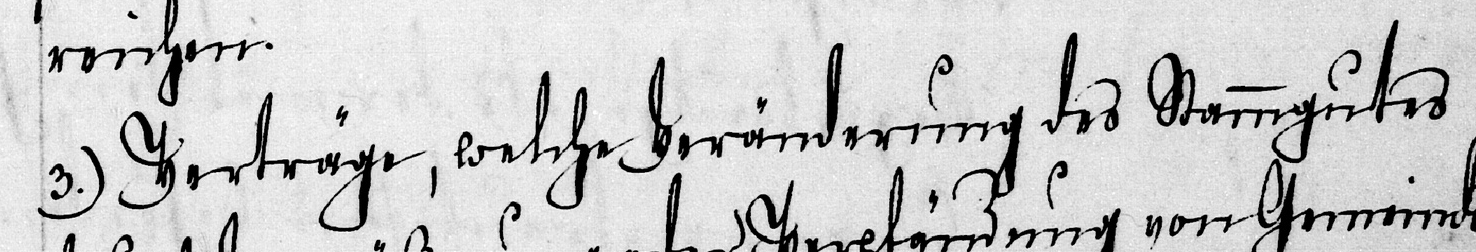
3.) Verträge, welche Veränderung des Stammgutes
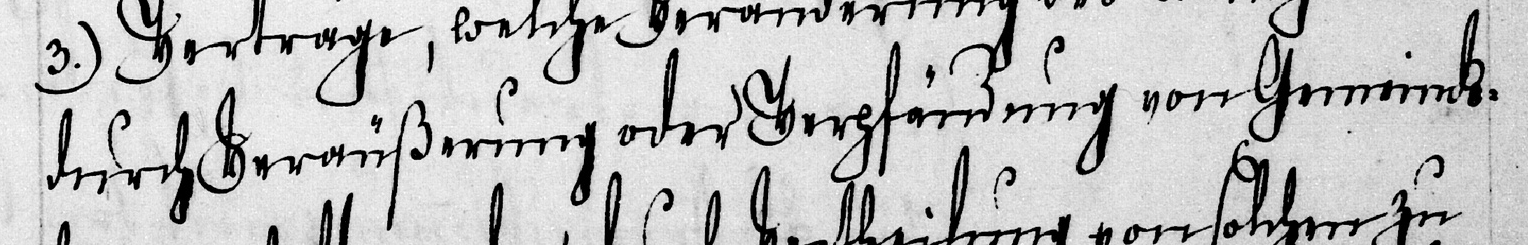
durch Veräußerung oder Verpfändung von Gemeinds¬
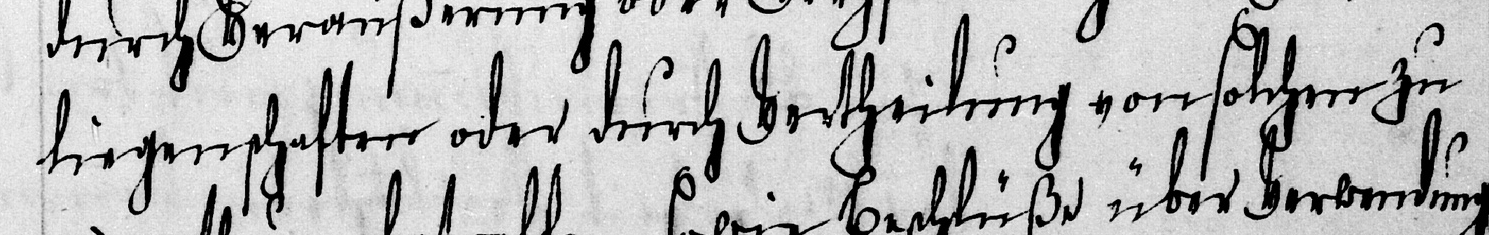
liegenschaften oder durch Vertheilung von solchen zu
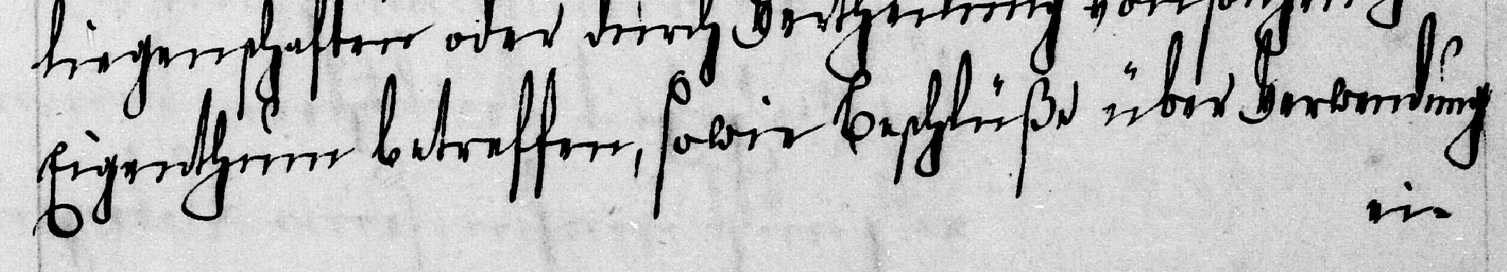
Eigenthum betreffen, sowie Beschlüße über Verwendung
